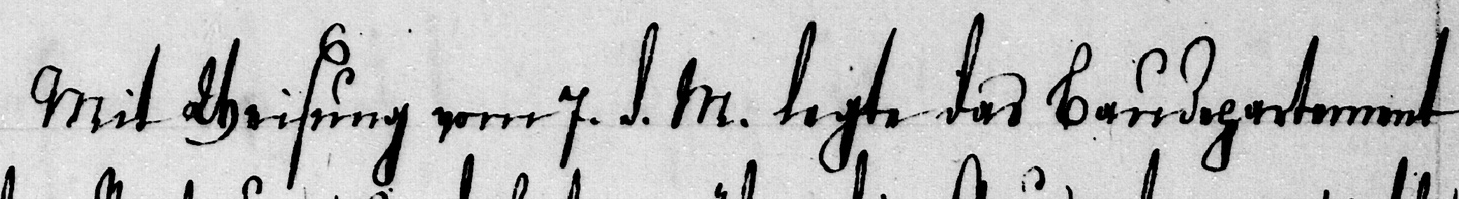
Mit Weisung vom 7. d. M. legte das Baudepartement
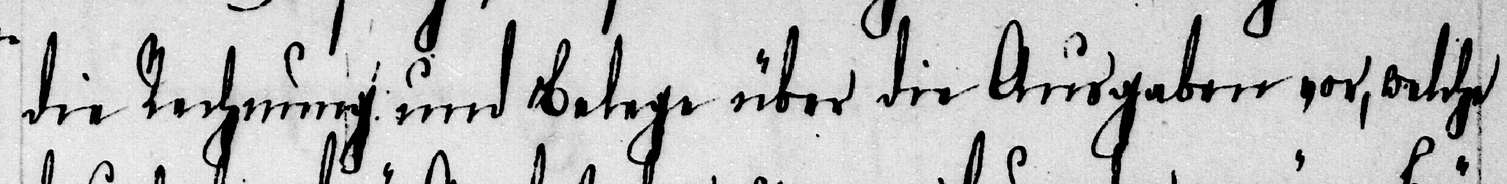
die Rechnung und Belege über die Ausgaben vor, welche
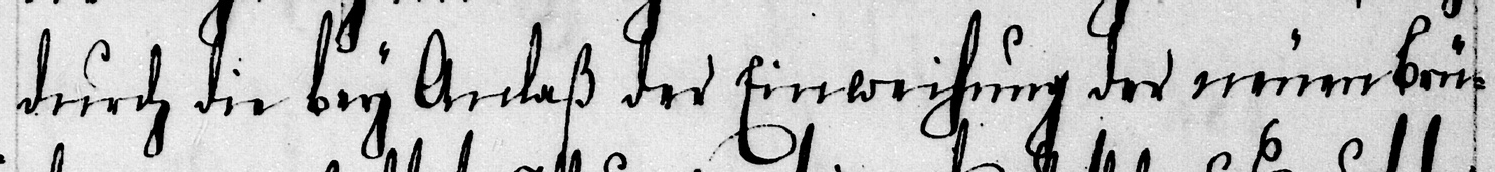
durch die bey Anlaß der Einweihung der neuen Brü¬
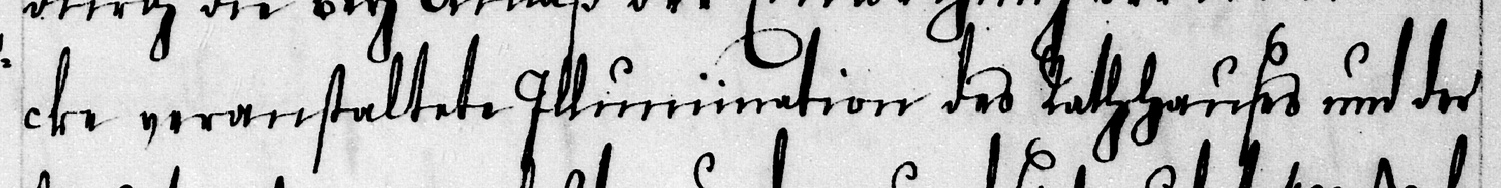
cke veranstaltete Illumination des Rathhauses und der
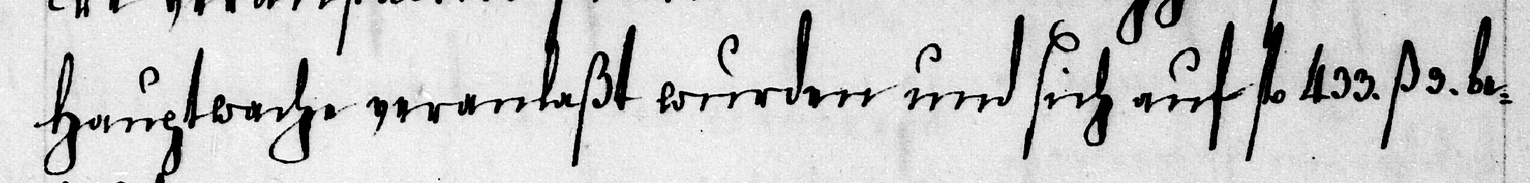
Hauptwache veranlaßt wurden und sich auf fl. 4330.ß 3.
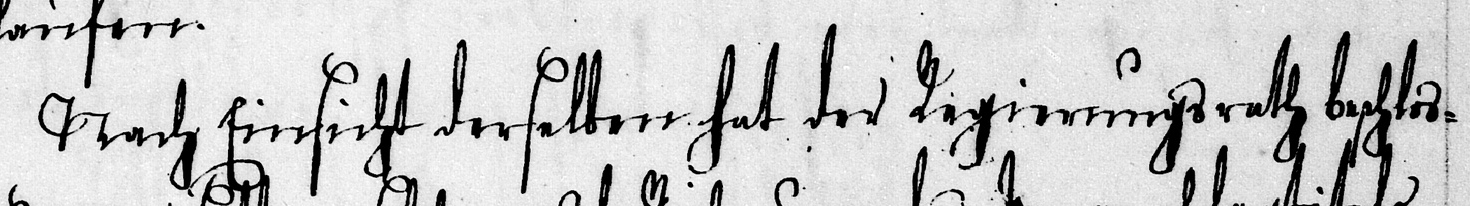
Nach Einsicht derselben hat der Regierungsrath beschl¬
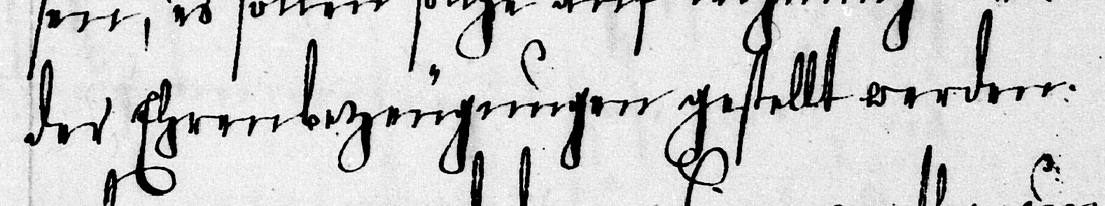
der Ehrenbezeugungen gestellt werden.
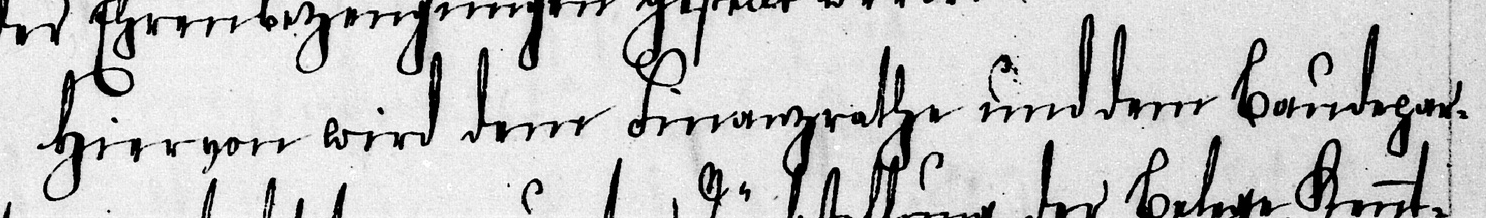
Hiervon wird dem Finanzrathe und dem Baudepar¬
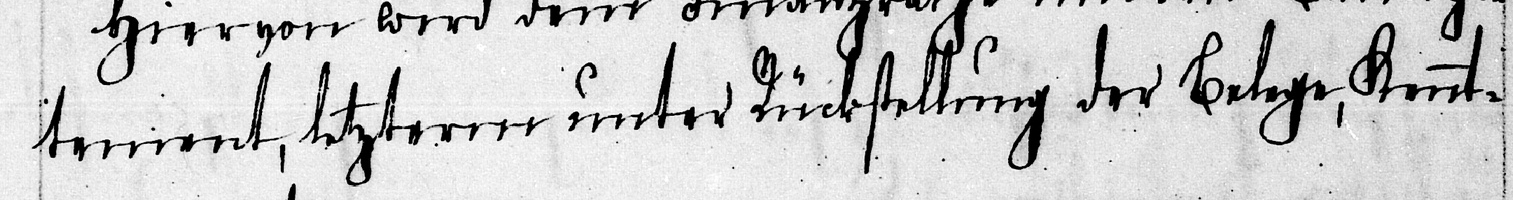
tement, letztern unter Rückstellung der Belege, Kennt¬
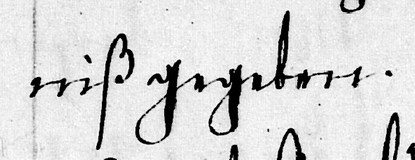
niß gegeben.
